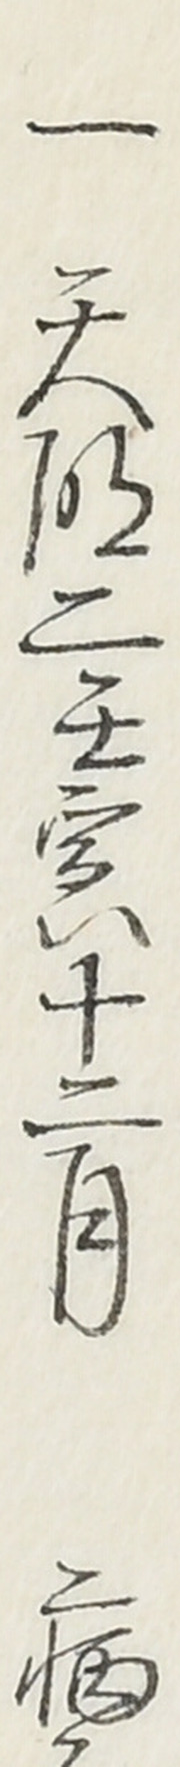一天明二壬寅十二月病死
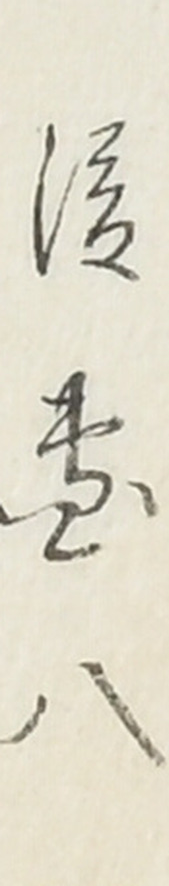後団八
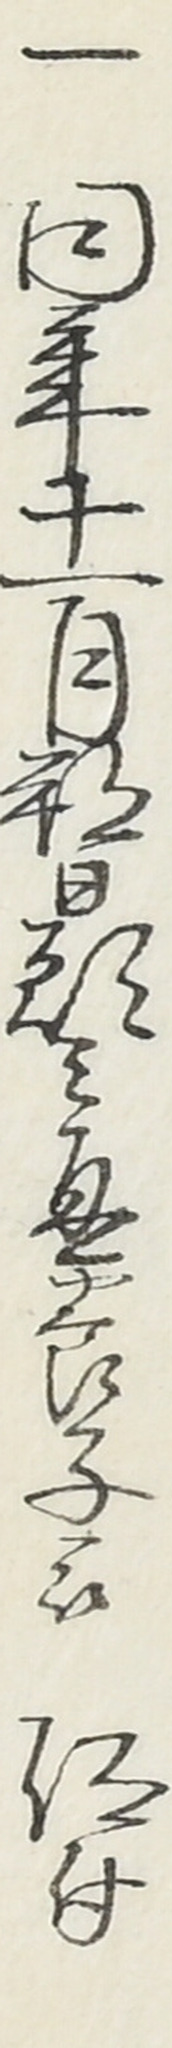一同年十一月朔日願之通養子被仰付
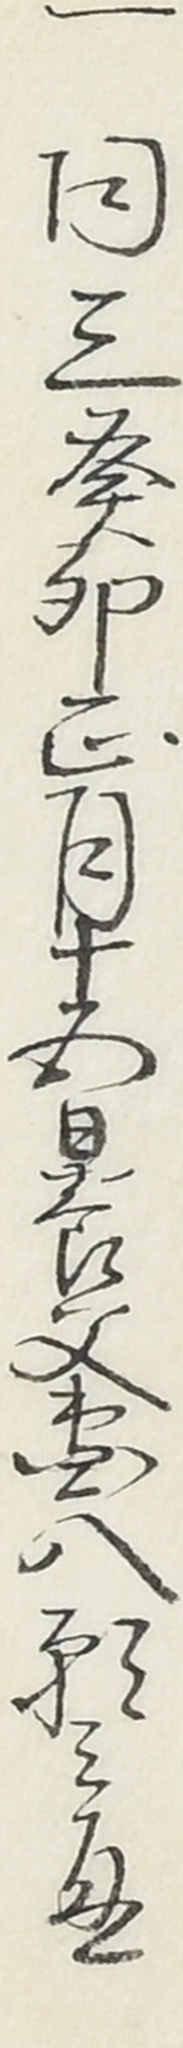一同三癸卯正月十五日養父団八願之通

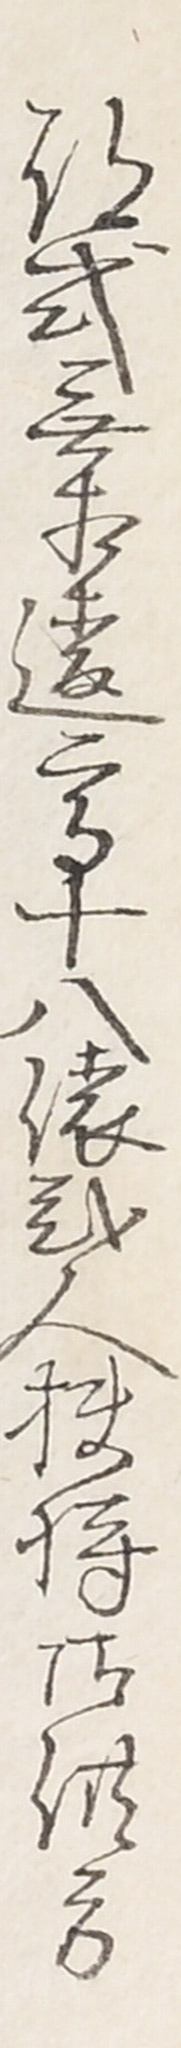跡式無相違高十八俵弐人扶持御供方
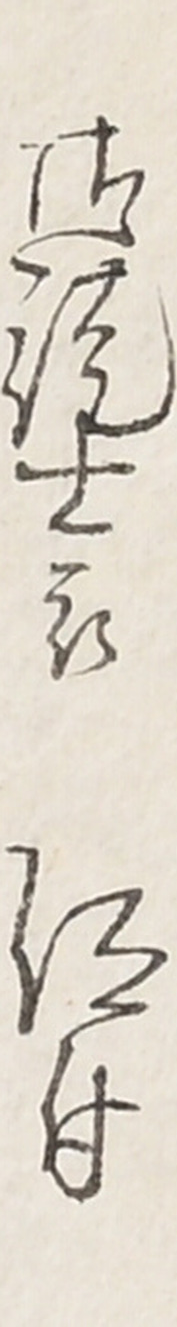御徒士被仰付
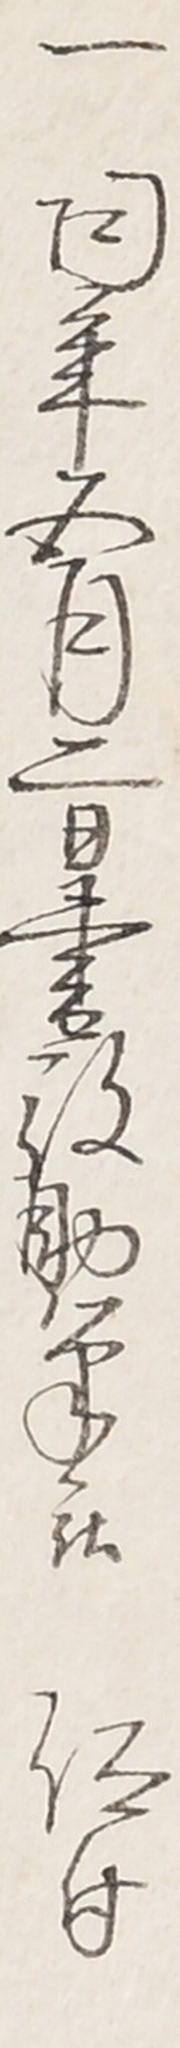一同年五月二日書役助筆被仰付
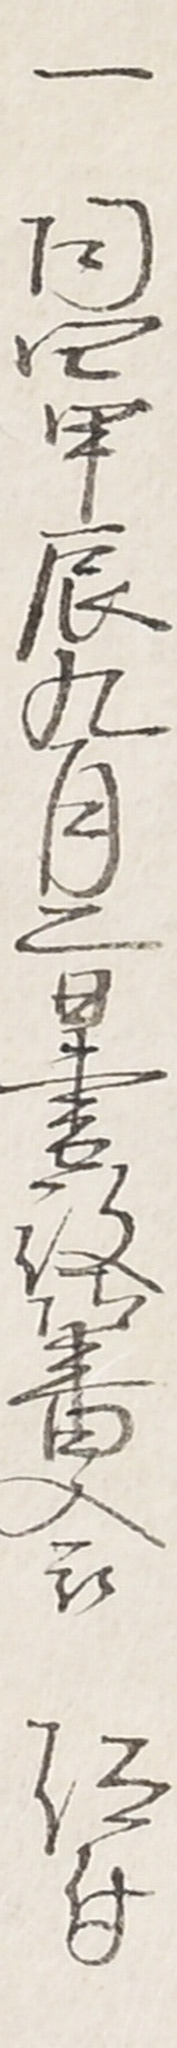一同四甲辰九月二日書役御番入被仰付
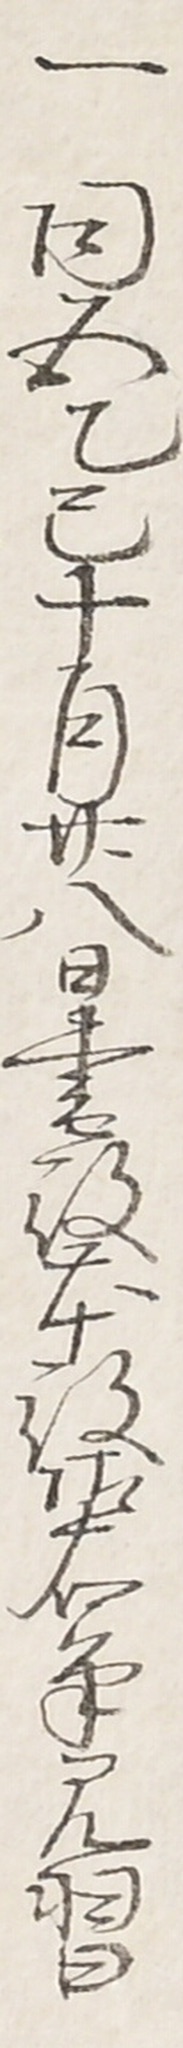一同五乙巳十月廿八日書役本役御右筆見習
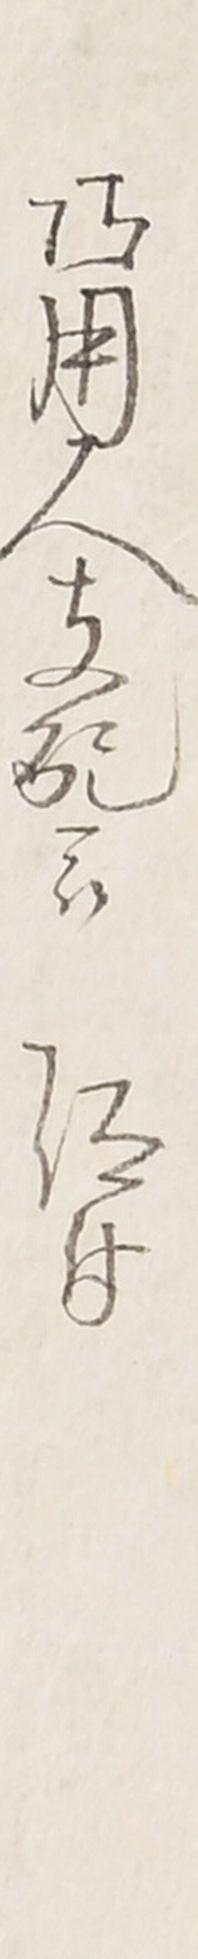御用人支配被仰付
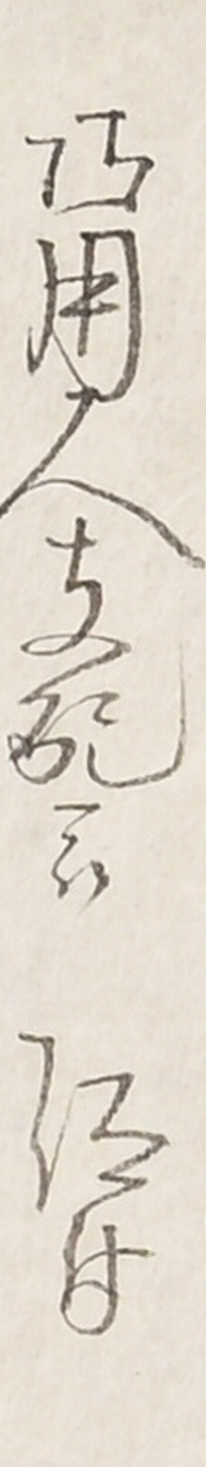御用人支配被仰付
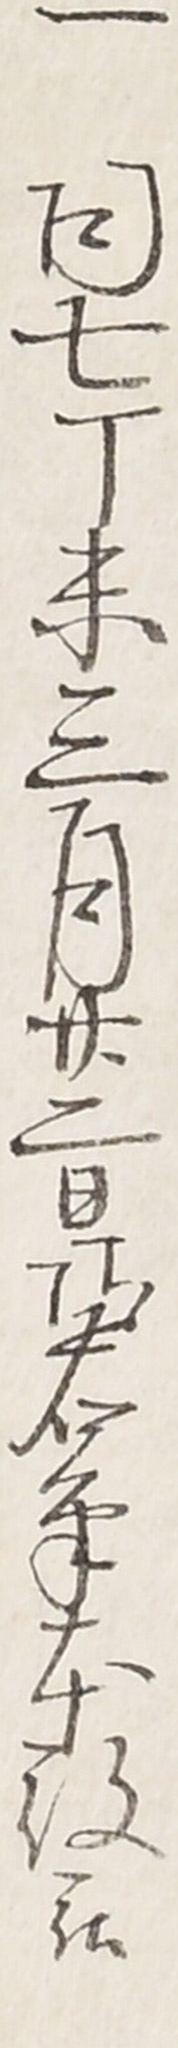一同七丁未三月廿二日御右筆本役被
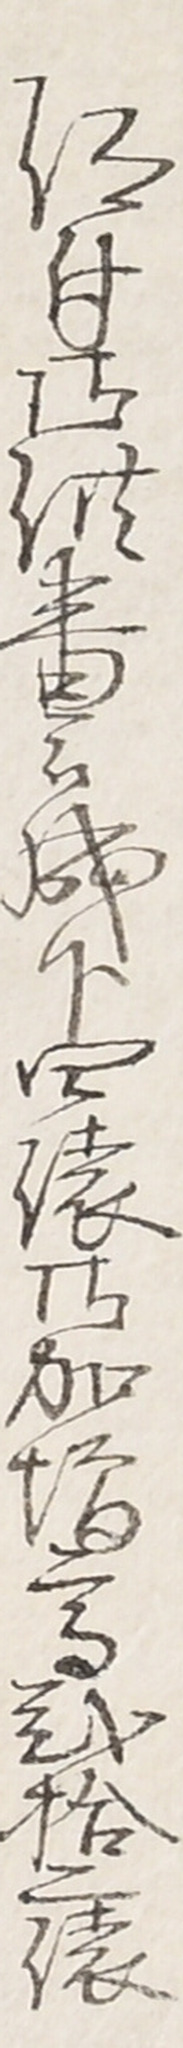仰付御供番被成下四俵御加増高弐拾二俵
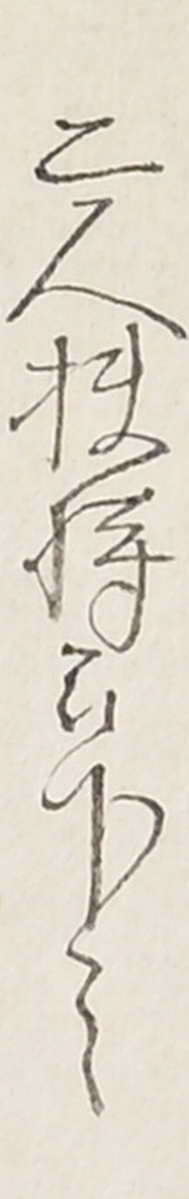二人扶持被下之
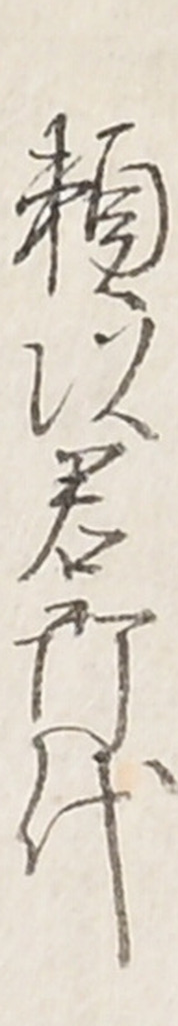頼以君御代
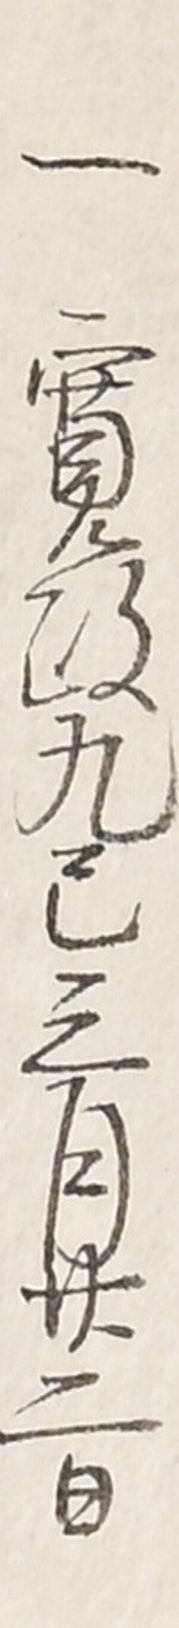一寛政九巳三月廿二日
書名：無足諸士勤仕録（四）
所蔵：伊那市立高遠町図書館・合同会社AMANE
